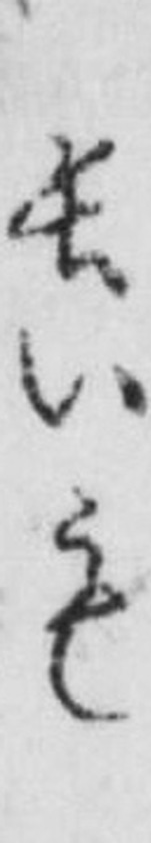長いも
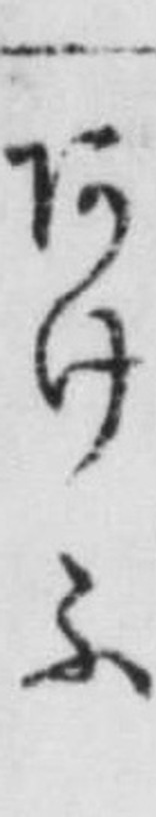あけふ
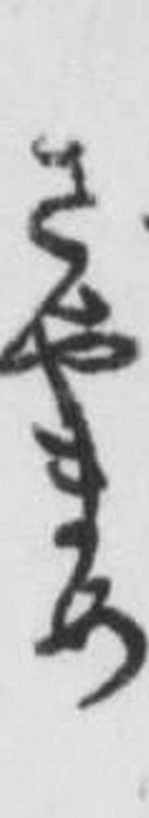さやまめ
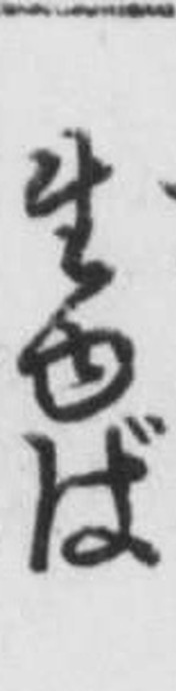生ゆば
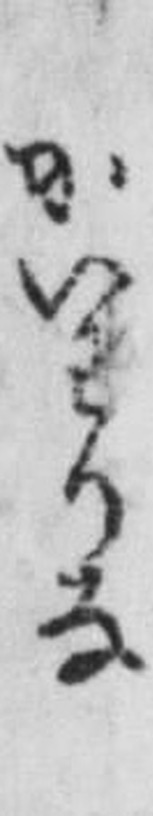かいわりな
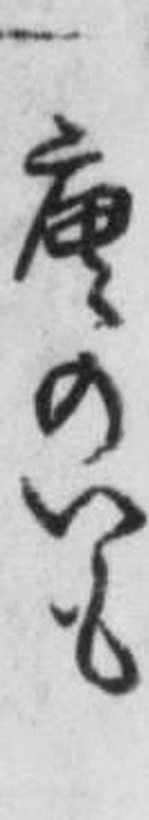唐のいも
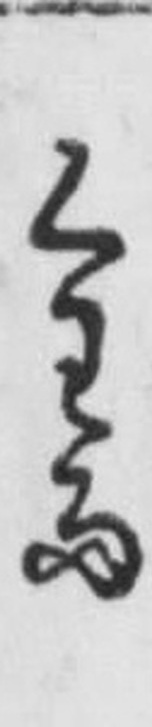くわゐ
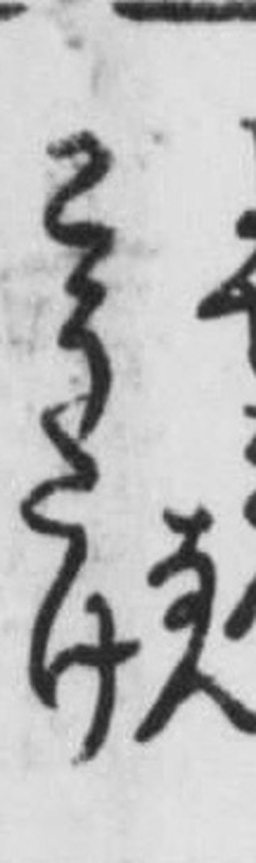こうたけ
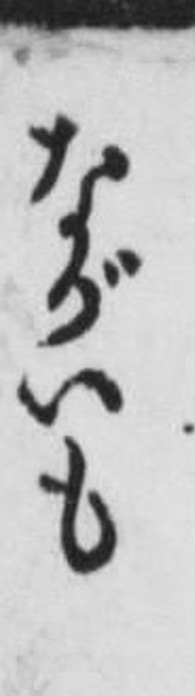ながいも
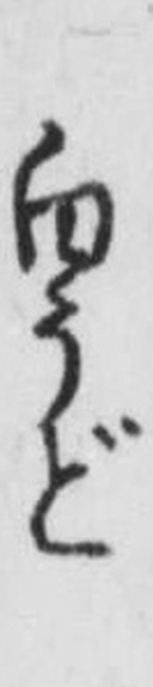白うど
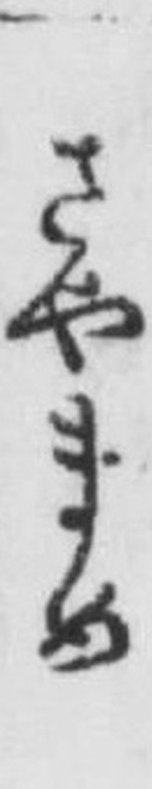さやまめ
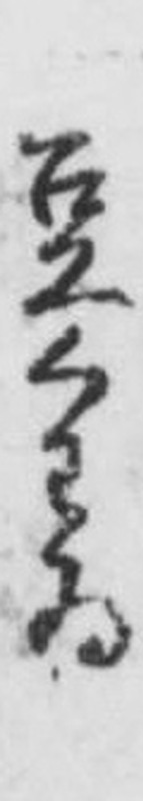豆くわゐ
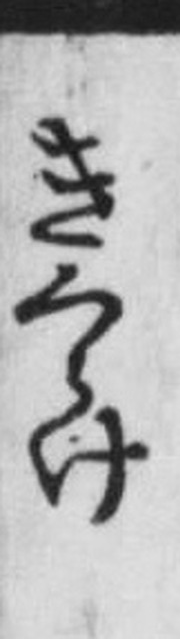きくらけ
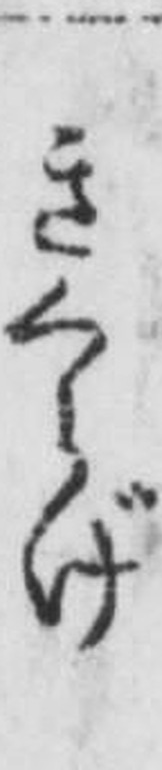きくらげ
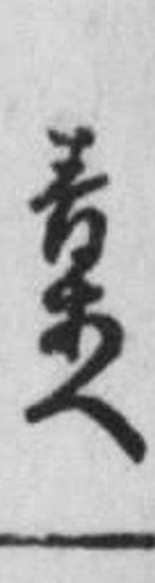青あへ
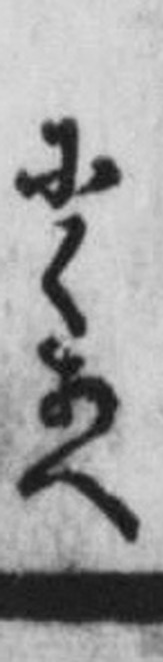にくあへ
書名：精進魚類間合料理/早速庖丁
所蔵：大阪府立大学学術情報センター 国文学研究資料館
